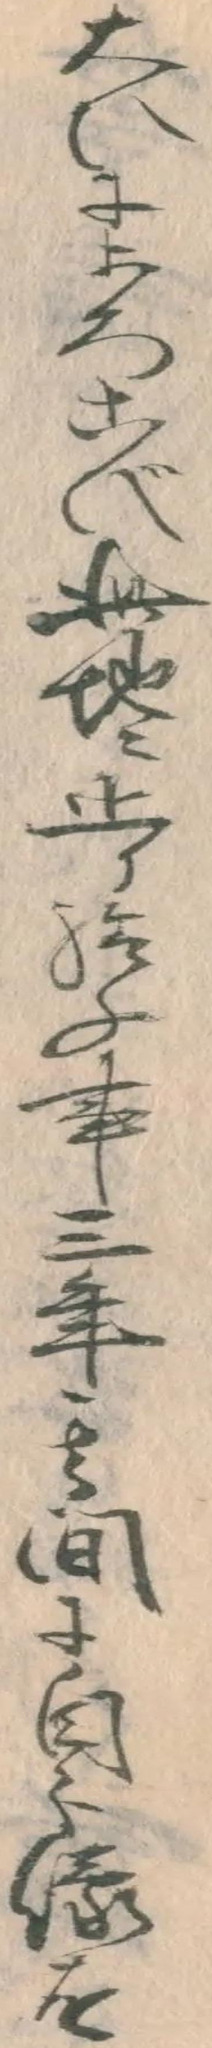大ひによろこび此地に止り給ふ事三年其間に自ら像を
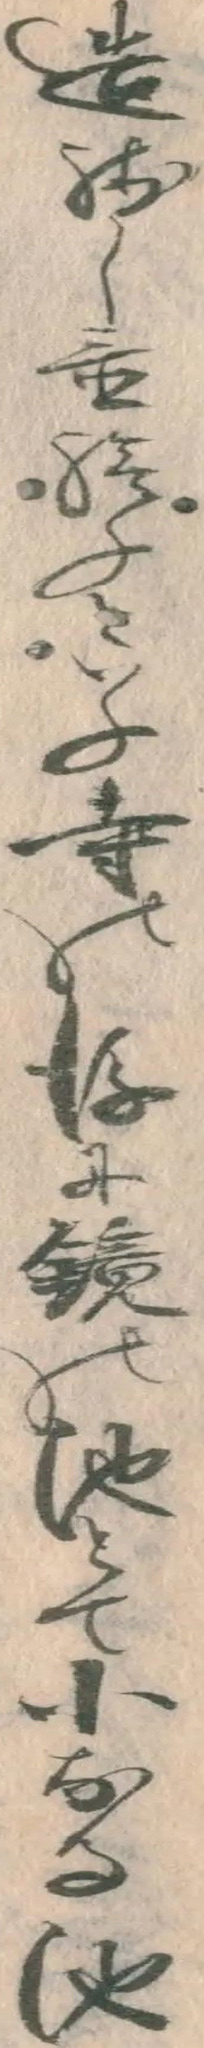造残し置給ふといふ寺の後に鏡の地とて小なる池
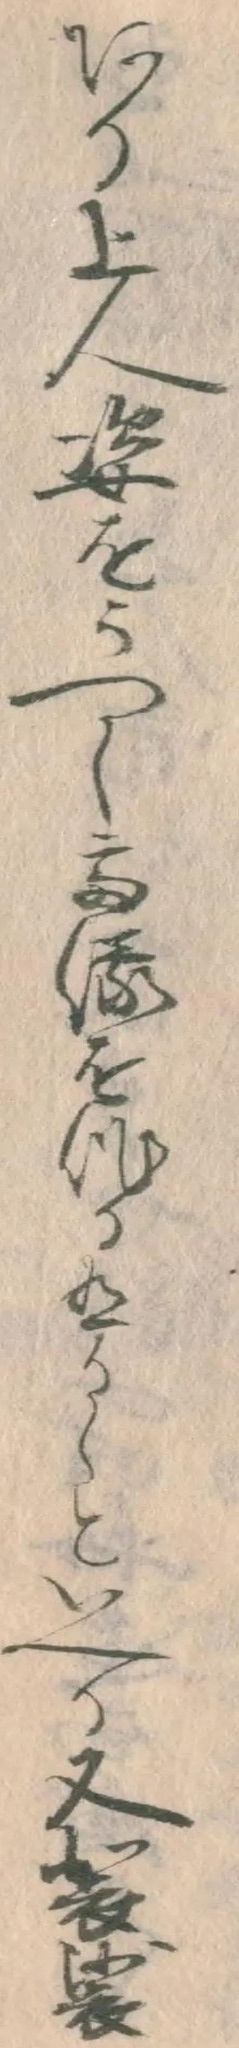あり上人姿をうつして像を作り有しといへり又袈裟
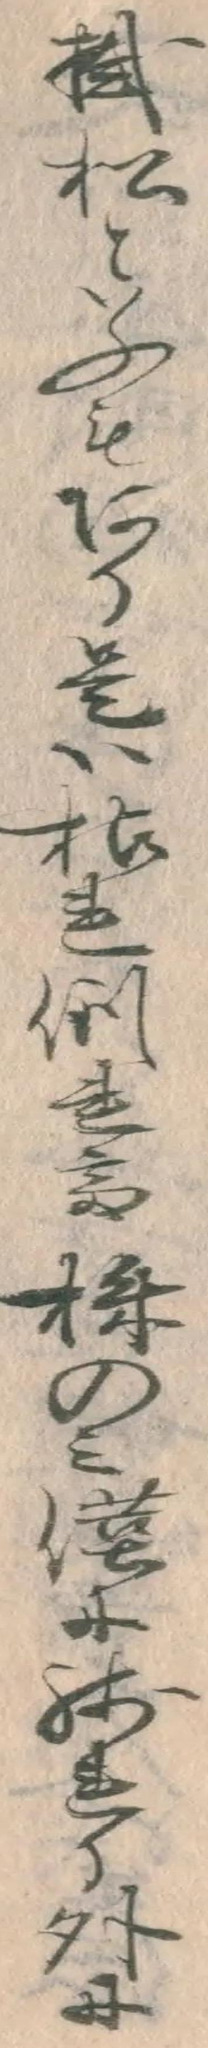掛松といふもあり是は枯れ倒れて柿のみ僅に残れり外に
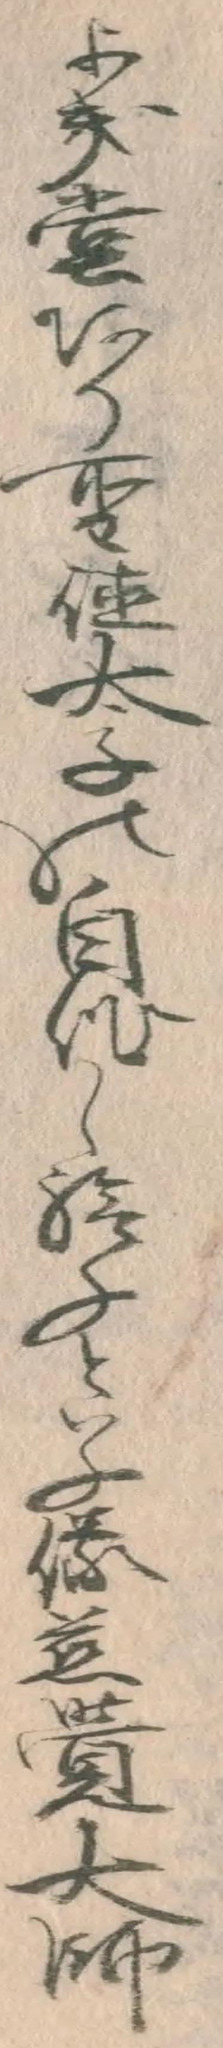よき堂あり聖徳太子の自作し給ふといふ像慈覚大師
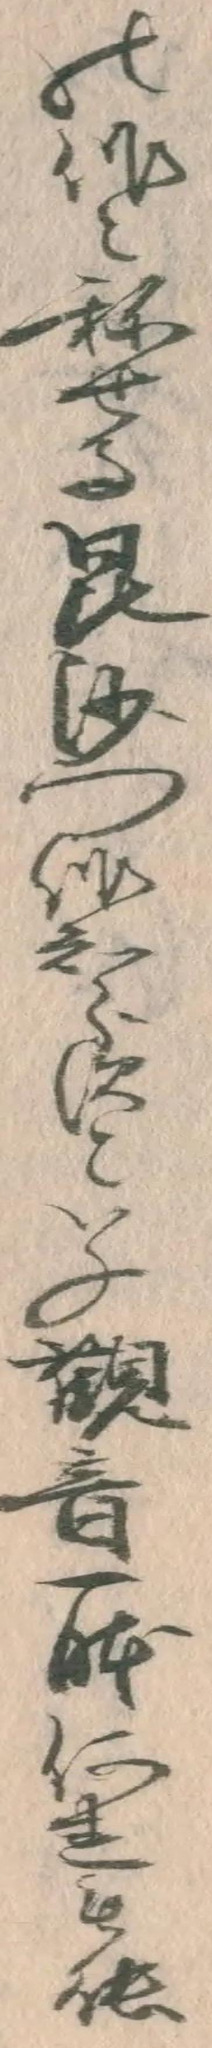の作と称せる毘沙門作知らすといふ観音一体何れも能
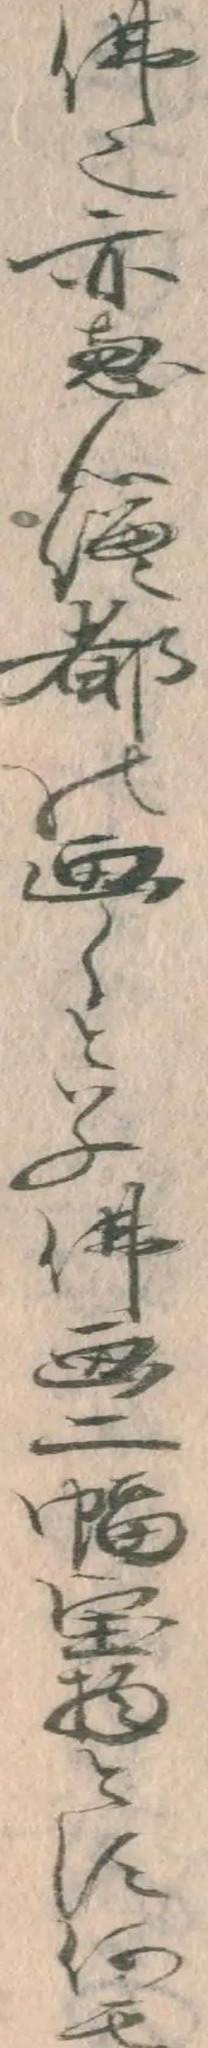仏也亦恵心僧都の画しといふ仏画二幅宝物とす何も
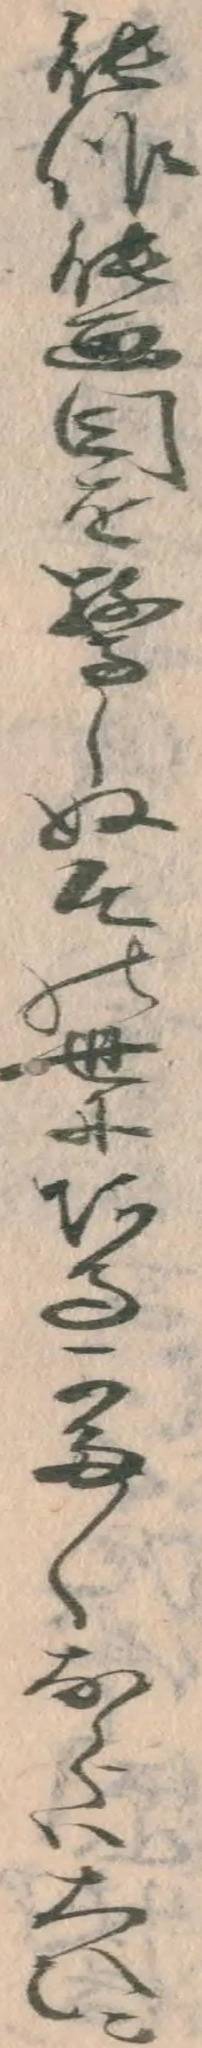能作能画目を驚しぬ今の世にあるかた〳〵ならは大ひに
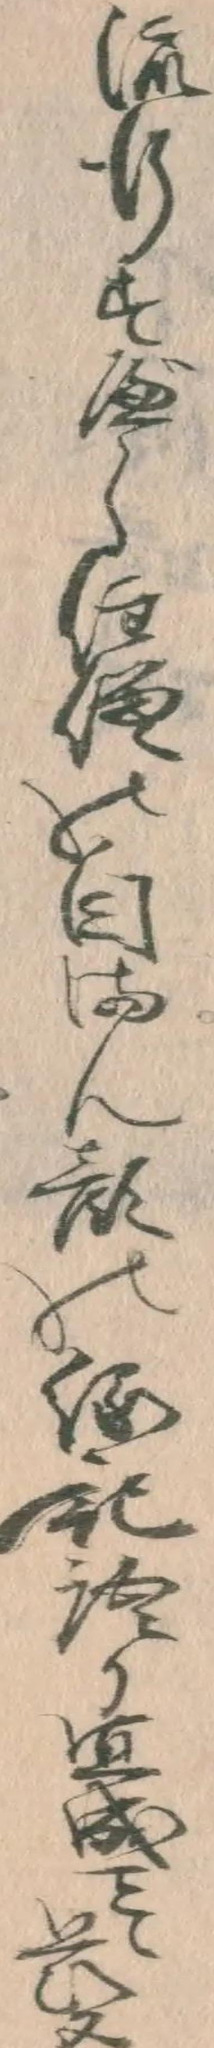流行すべし住僧の自まん顔の縁起語り宜成ことゝ思ひぬ
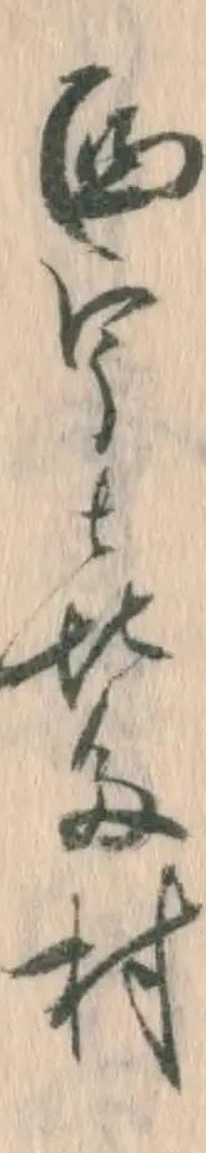西宇喜多村
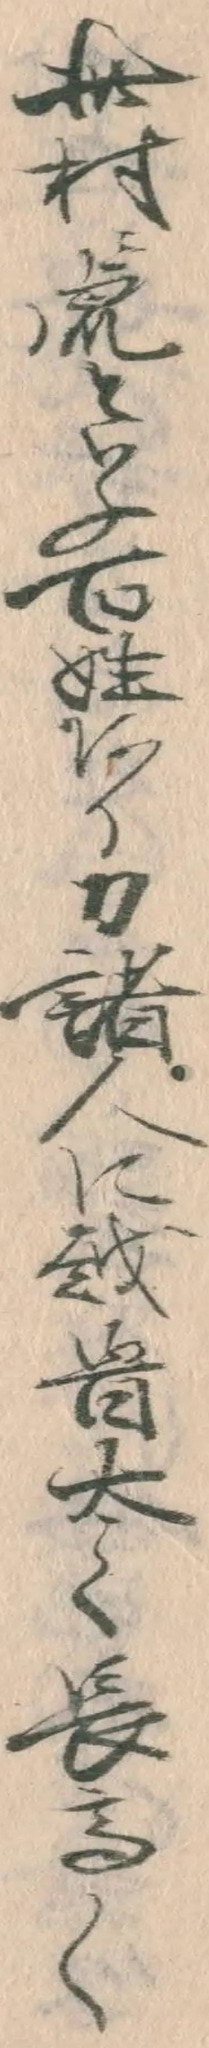此村に虎といふ百姓あり力諸人に越骨太て長高し
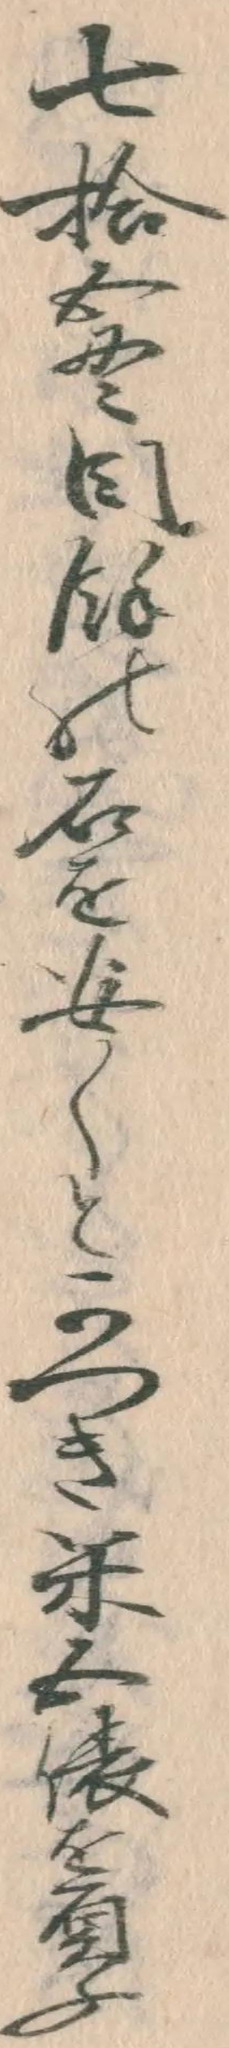七拾五貫目余の石を安〳〵とかつき米五俵を負ふ
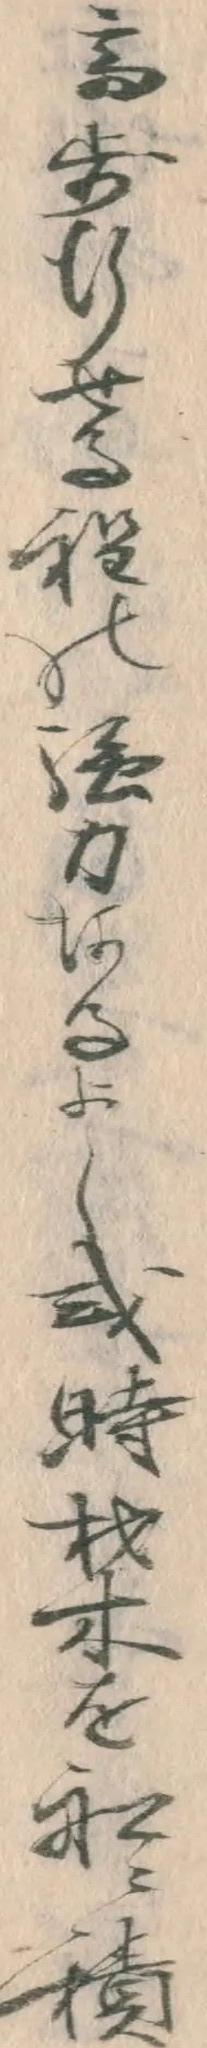て歩行せる程の強力なるよし或時材木を船に積
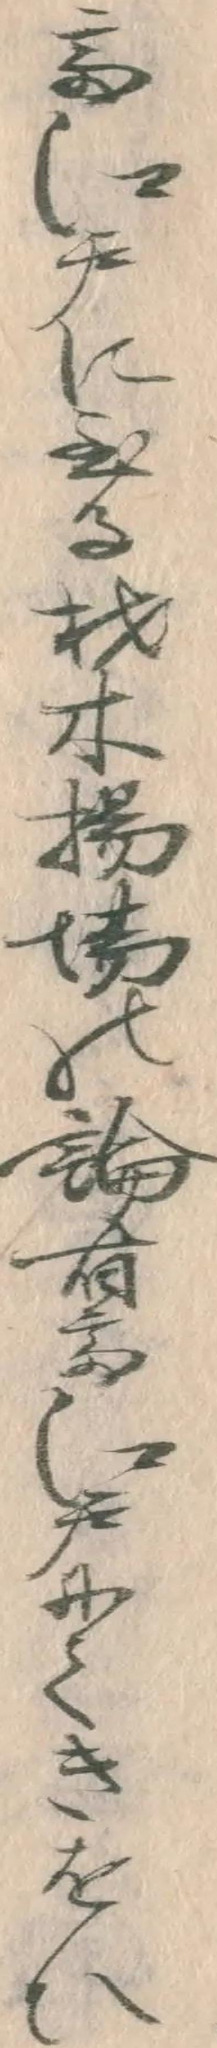て江戸に至る材木揚場の論有て江戸にてきをひ
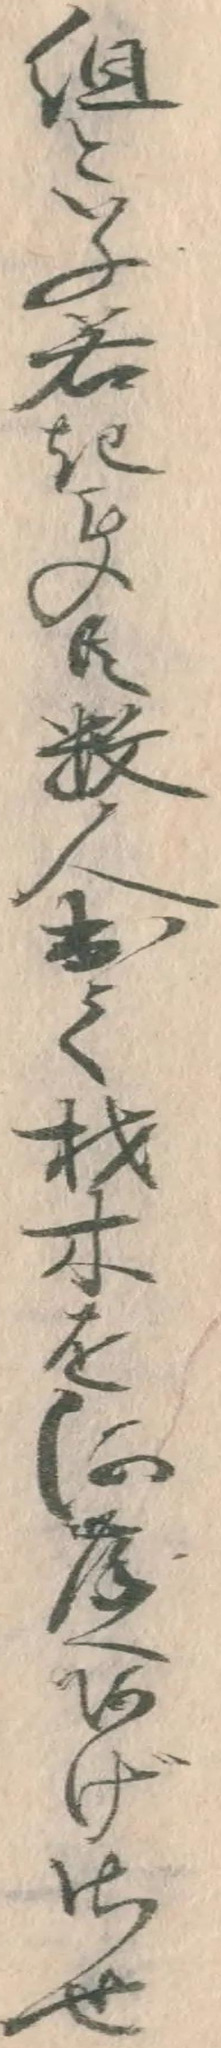組といふ若きもの共数人出て材木を河岸へあげさせ
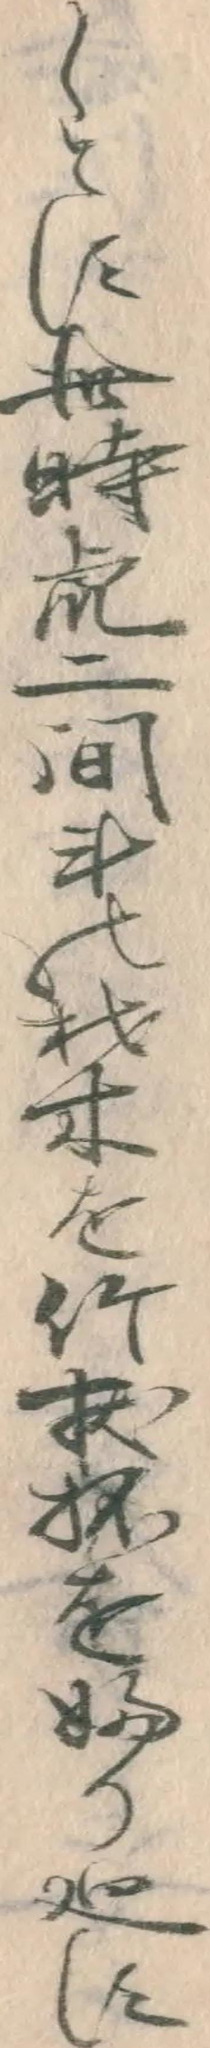しとす此時虎二間斗の材木を竹杖抔をふり廻す
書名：四神地名録 6巻. [4]葛飾郡
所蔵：国立国会図書館 National Diet Library, JAPAN
